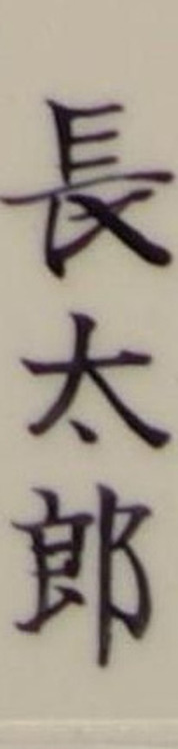長太郎
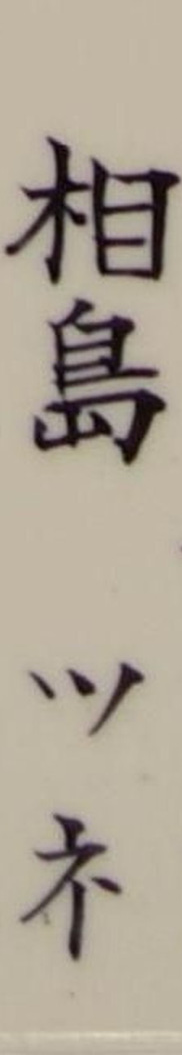相島ツネ
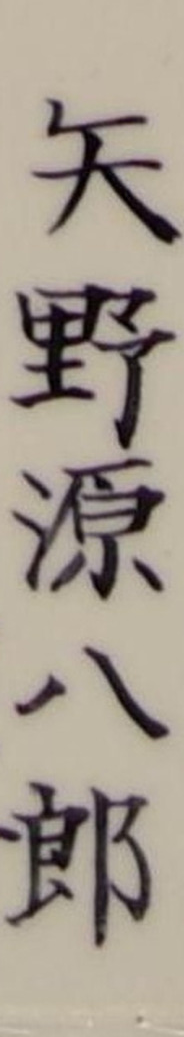矢野源八郎
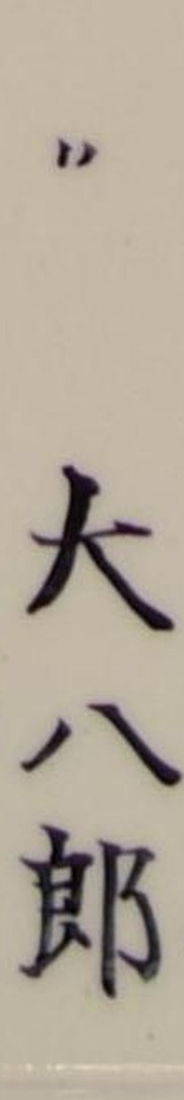大八郎
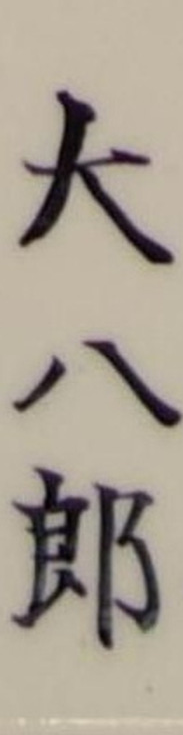大八郎
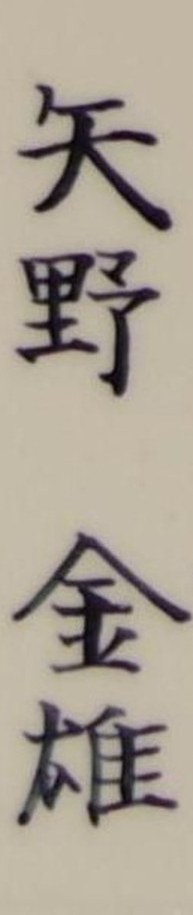矢野金雄
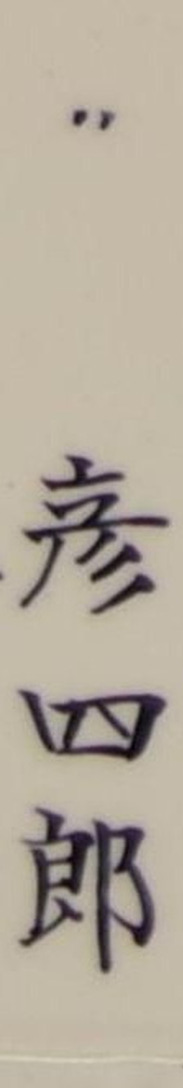彦四郎
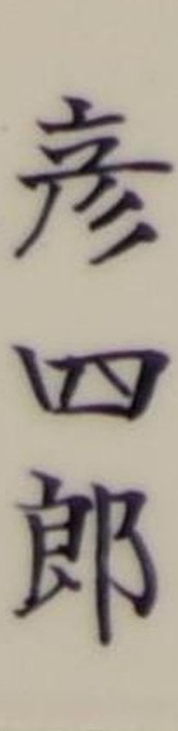彦四郎
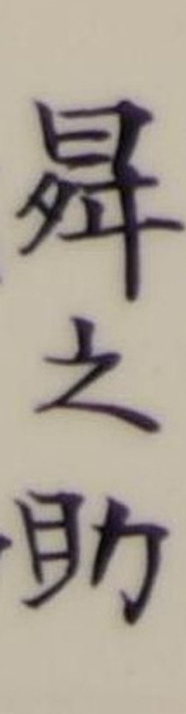昇之助
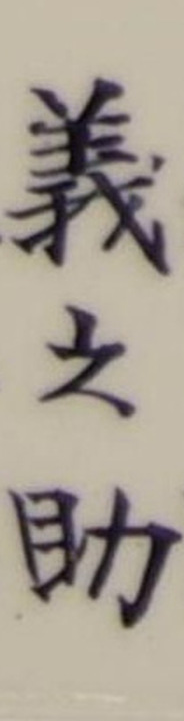義之助
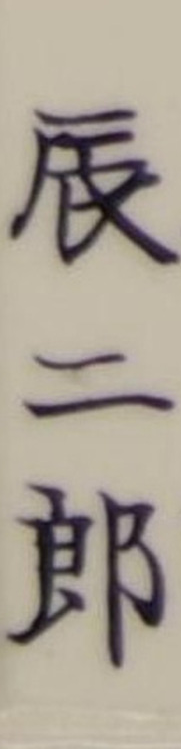辰二郎

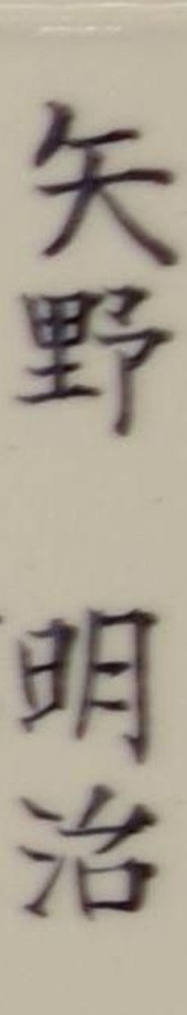矢野明治
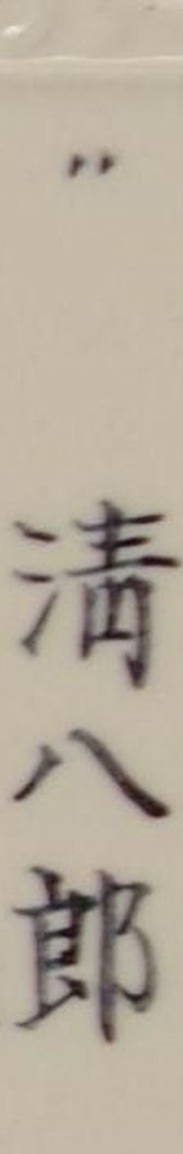清八郎
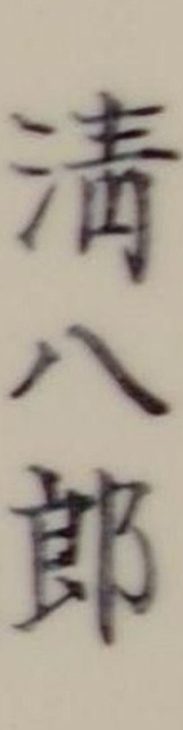清八郎
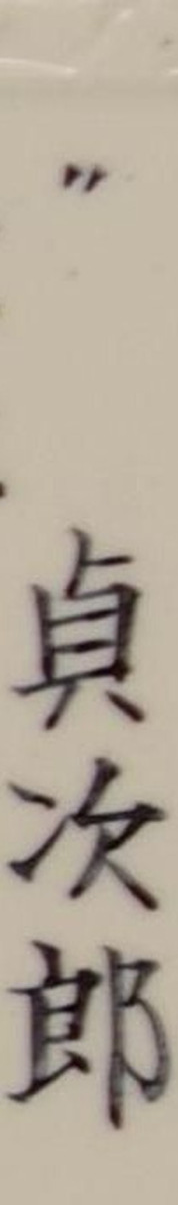貞次郎
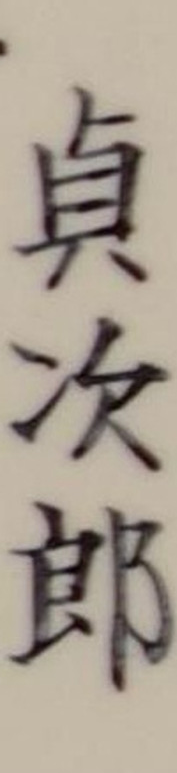貞次郎
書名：E~L
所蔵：高野山金剛峯寺
